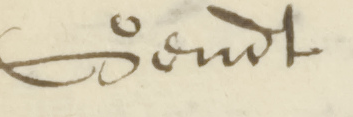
Gendt
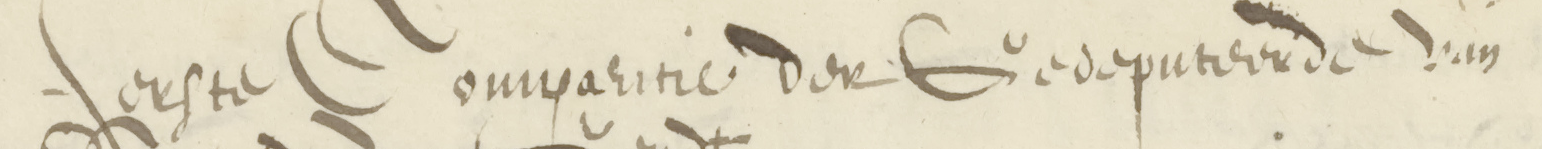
Eerste Comparitie der Gedeputeerde van
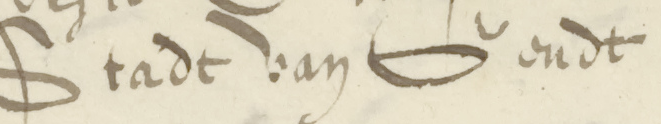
Stadt van Gendt
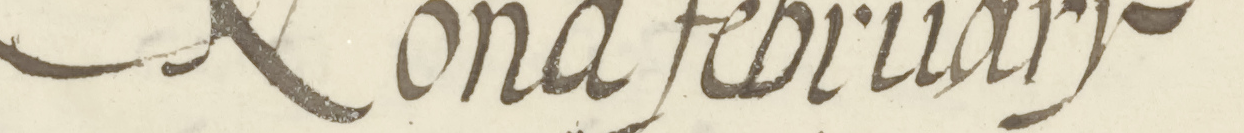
Nona February
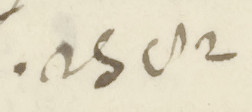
1582
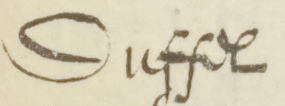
Duffel
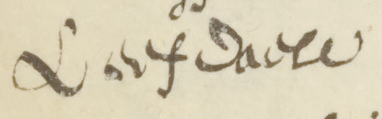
Leefdaele
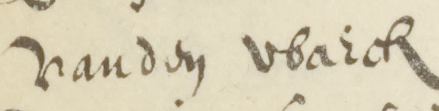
vanden Waick
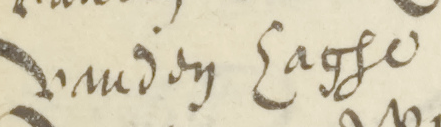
vanden Haghe
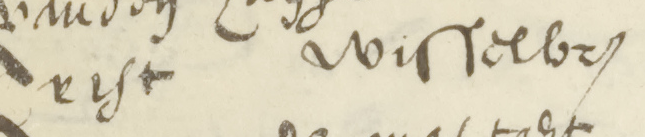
Trist wisselbr
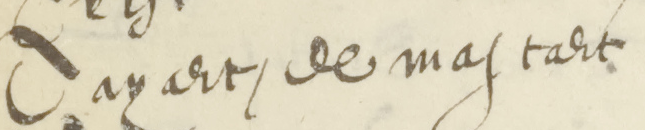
Tayaert, de mastaert
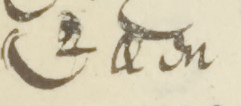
Caen
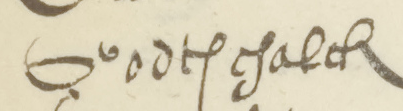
Godtschalck
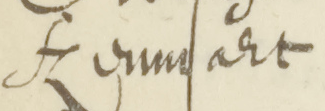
Keinnaert
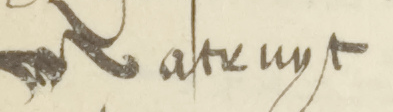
Matruyt
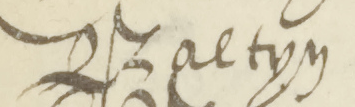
Baltyn
